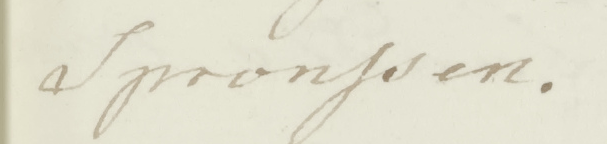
Spronssen.
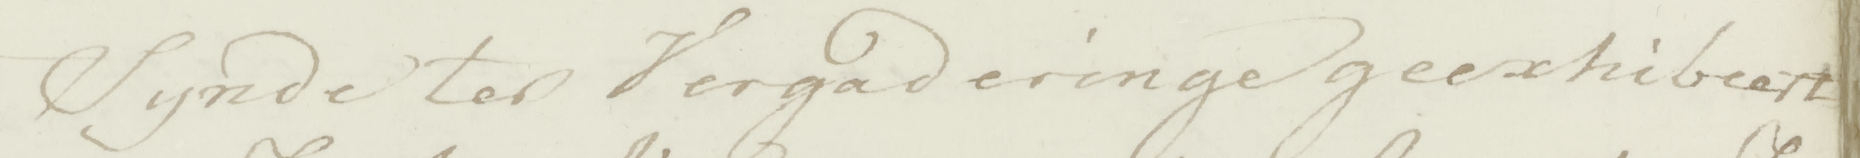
Sijnde ter Vergaderinge geextibeert
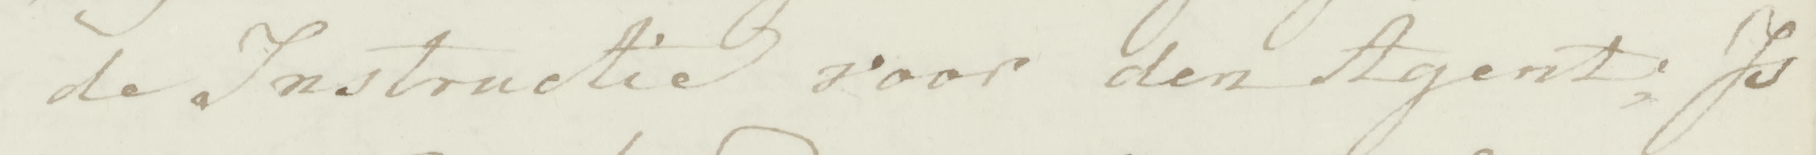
de Instructie voor den Agent; Is
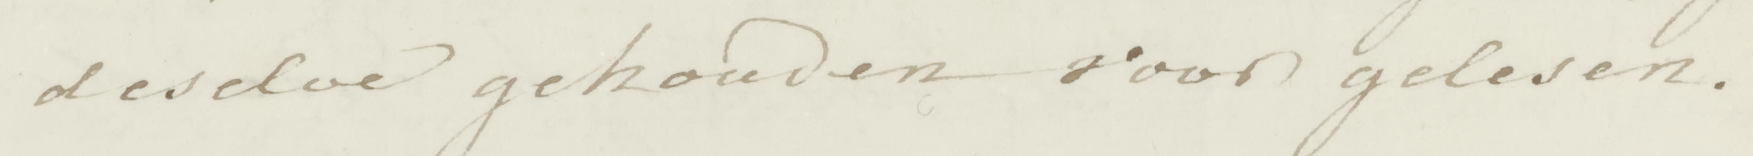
deselve gehouden voor gelesen.
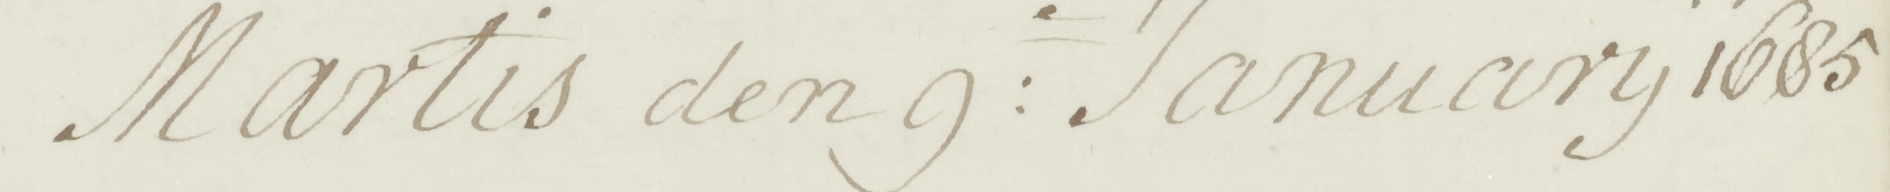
Martis den 9e: Januarij 1685.
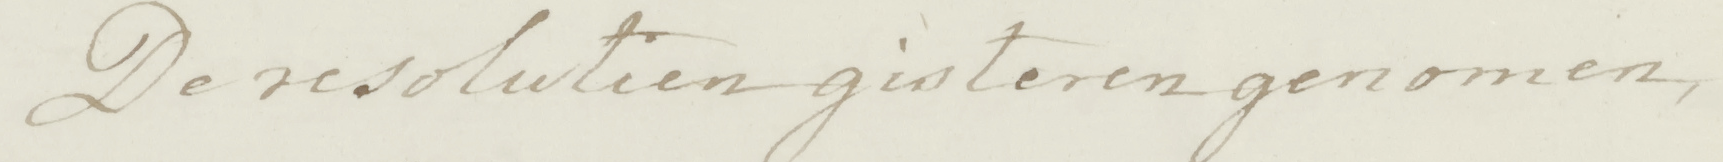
De resolutien gisteren genomen,
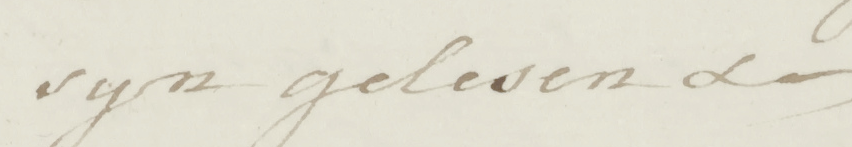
syn gelesen &
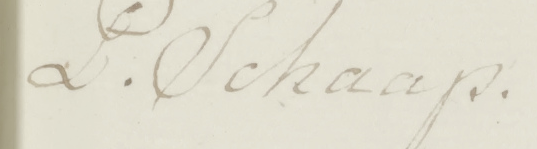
P. Schaap
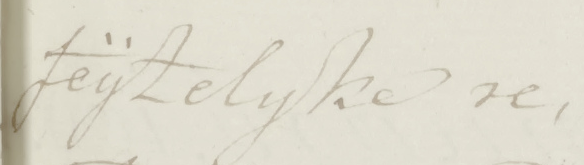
Feijtelijke re,
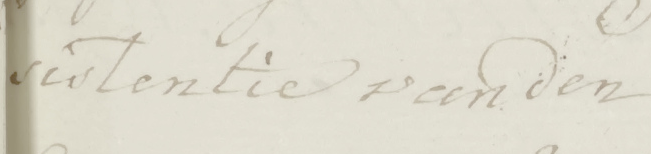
sistentie van den
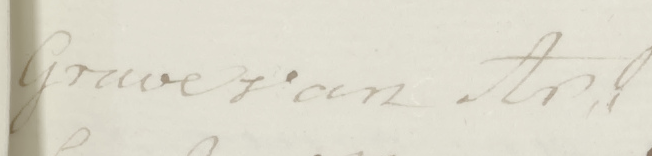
Grave van Ar„
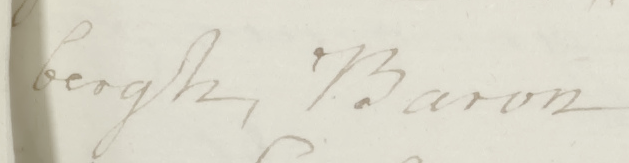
bergh, Baron
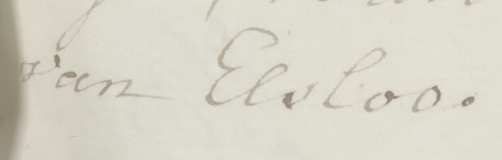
van Elsloo.
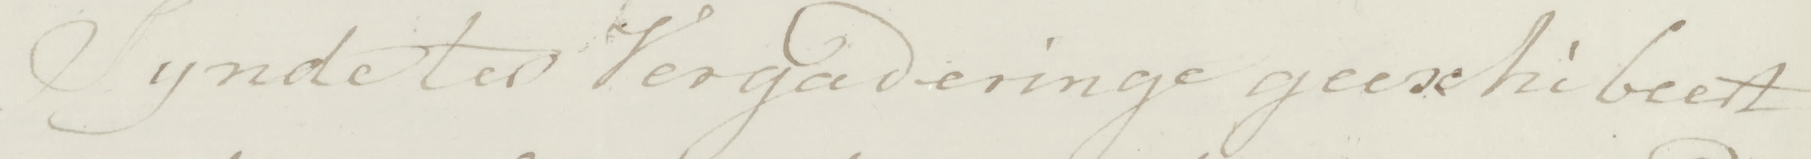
Sijnde ter Vergaderinge geexhibeert
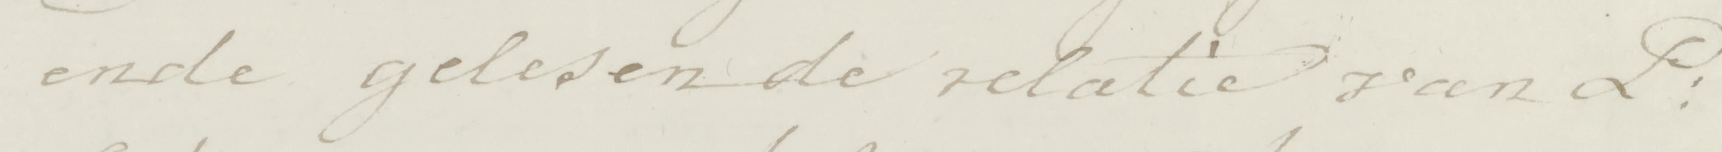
ende gelesen de relatie van P:
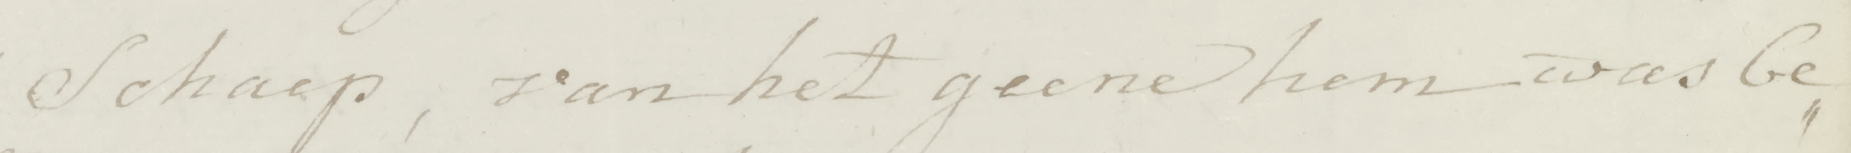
Schaep, van het geene hem was be„
